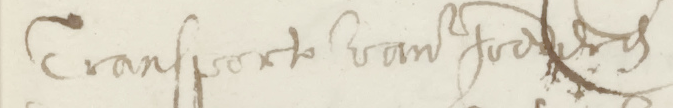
Transport van goederen
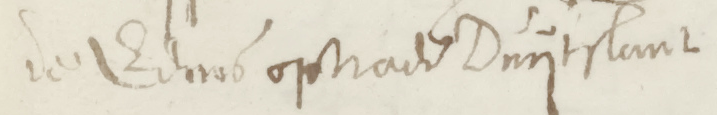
de Eems op naer Duijtslant
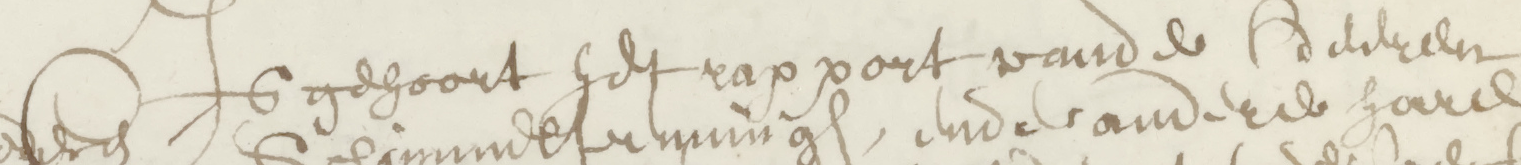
Is gehoort het rapport vande Heeren
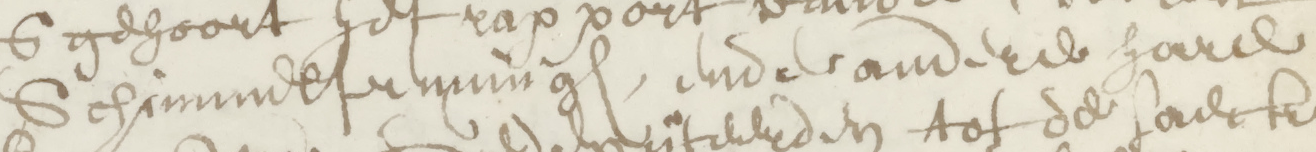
Schimmelpenningh, ende andere hare
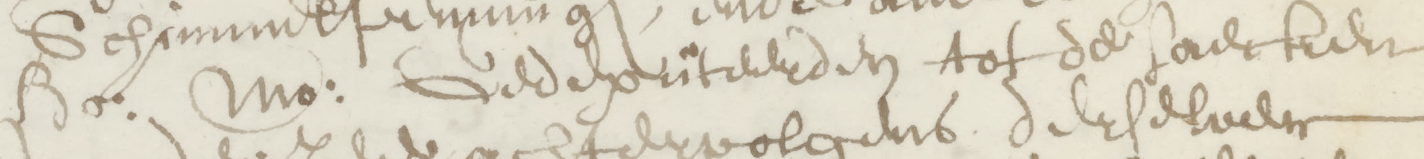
Ho:Mo: Gedeputeerden tot de saecken
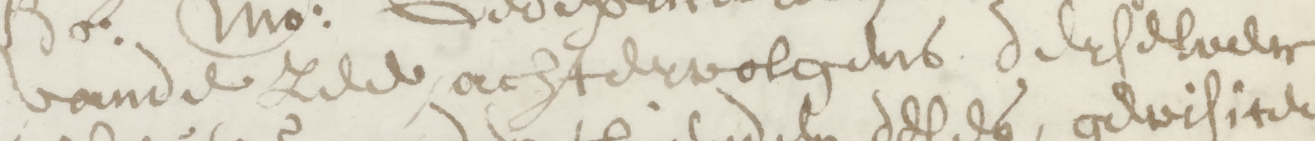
vande zee, achtervolgens derselver
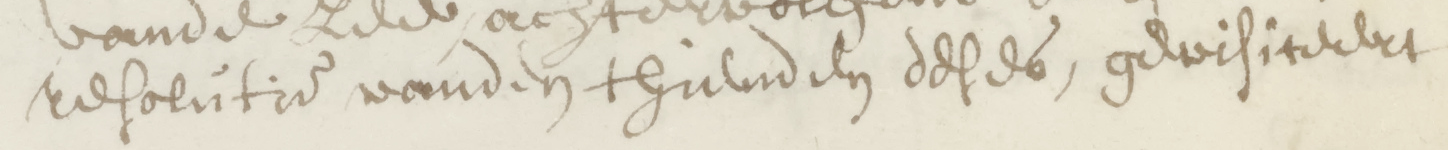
resolutie vanden thienden deses, gevisiteert
